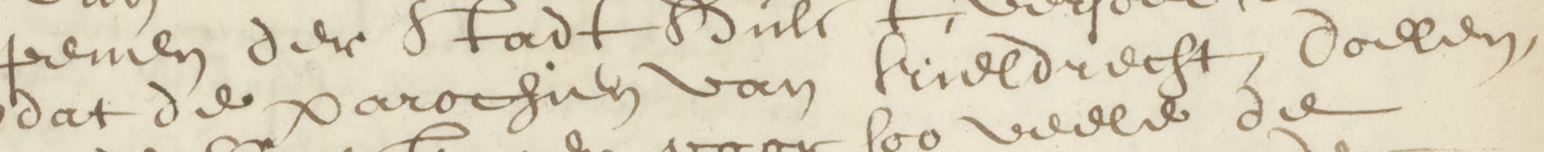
dat de parochien van Kieldrecht, Doelen,
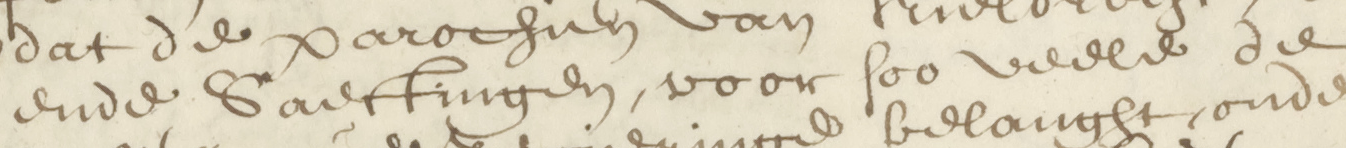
ende Saeftingen, voor soo veele de
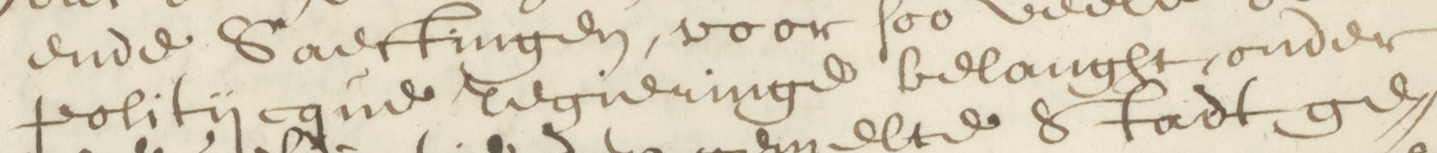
politijcque regieringe belanght, onder
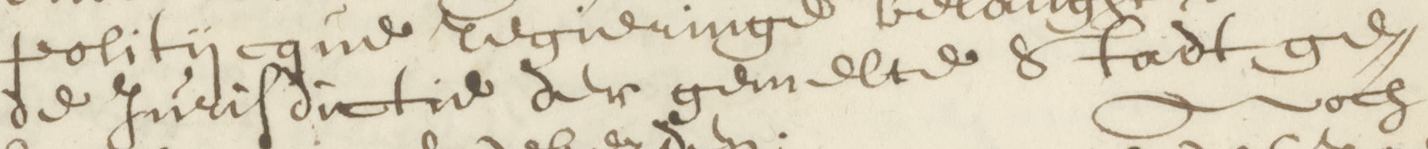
de Jurisdictie der gemelte Stadt ge„
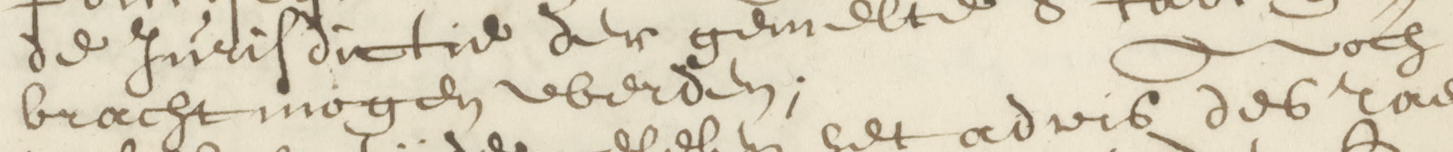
bracht mogen worden; Noch
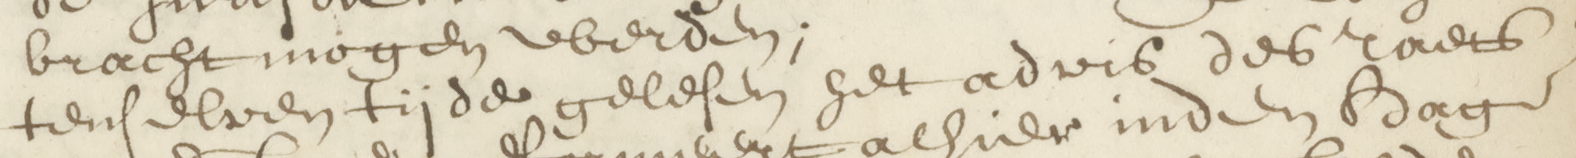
tenselven tijde gelesen het advis des raets
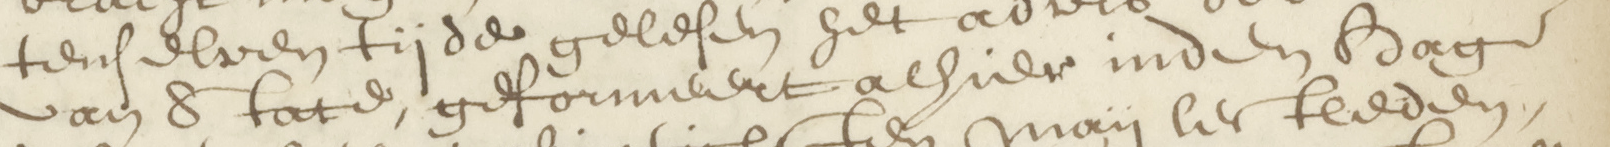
van State, geformeert alhier inden Hage
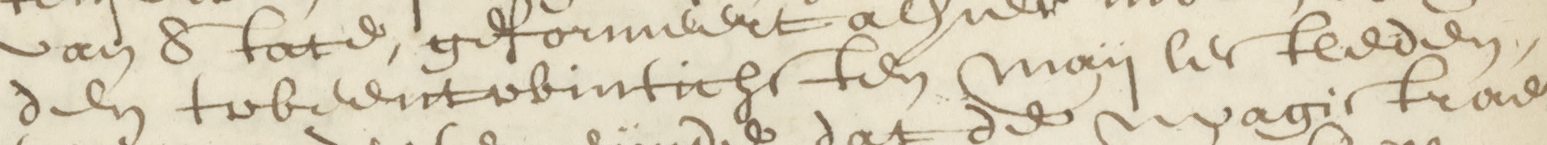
den tweentwintichsten maij lestleden,
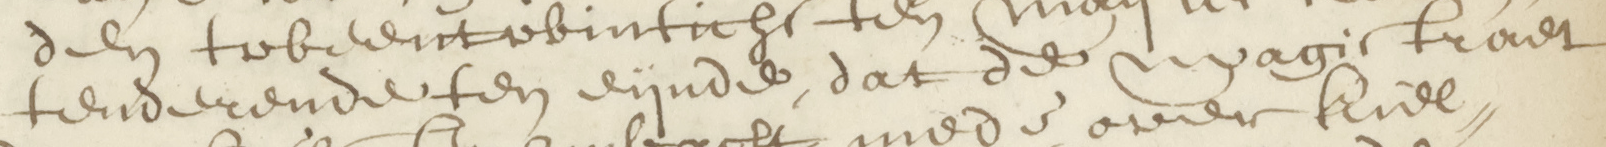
tenderende ten eijnde, dat de magistraet
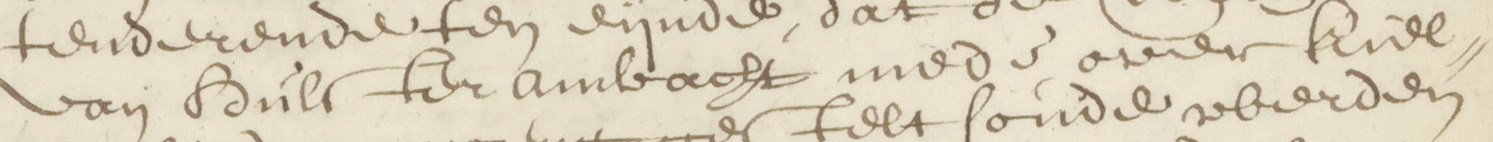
van Hulster Ambacht mede over Kiel„
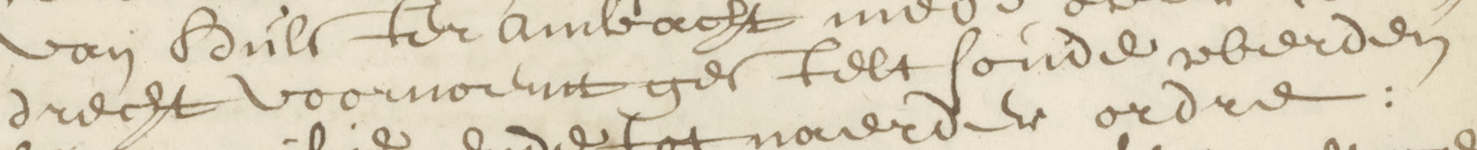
drecht voornoemt gestelt soude worden
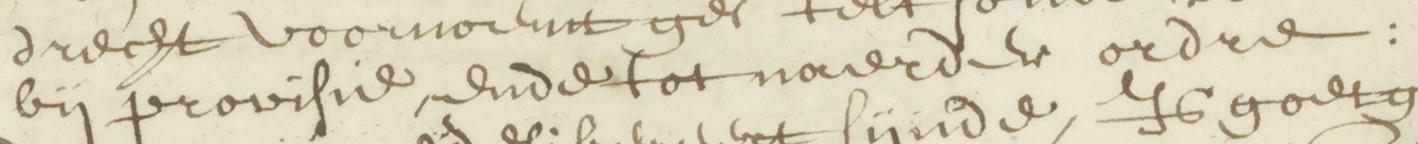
bij provisie ende tot naerder ordre:
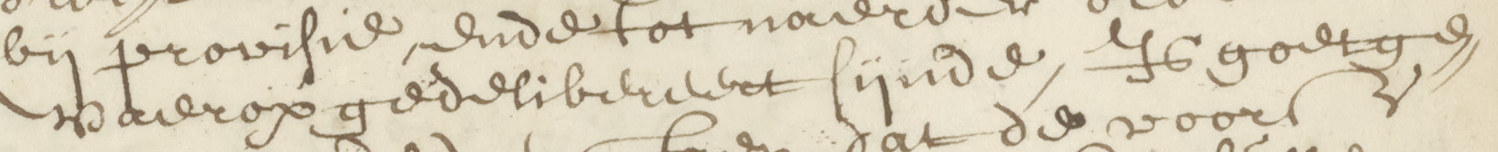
Waerop gedelibereert sijnde, Is goetge„
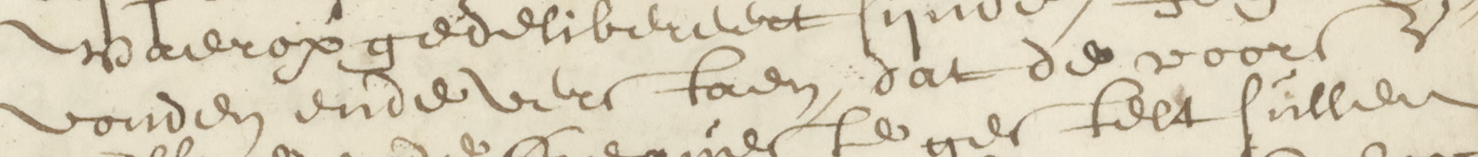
vonden ende verstaen, dat de voorsz
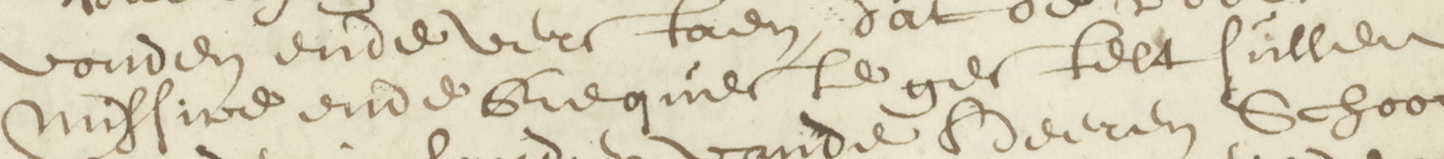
Missive ende Requeste gestelt sullen
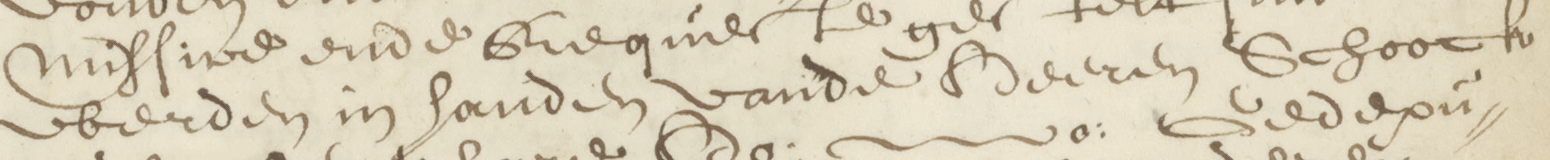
worden in handen vande Heeren Schoock
